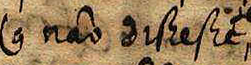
q̄ não dissesse
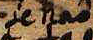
senaõ
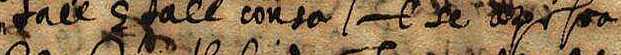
tall E tall cousa / E se a pesoa
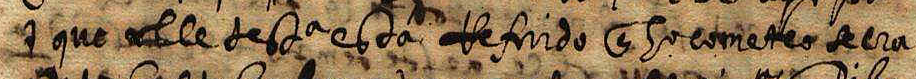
ē que elle testa esta Referido q̄ ho cometeo se era
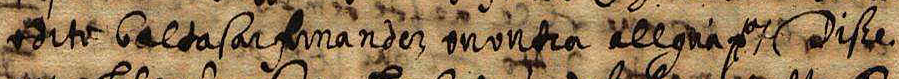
o dito baltasar fernandez ou outra allgua pa / Disse
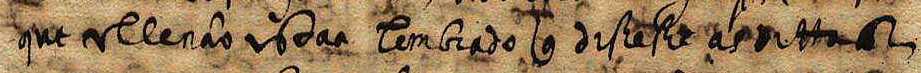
que elle não estaa lembrado q̄ dissesse as dittas
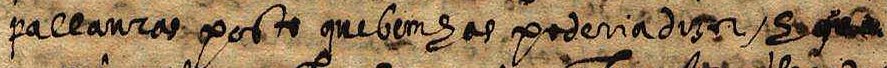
pallauras posto que bem has poderia dizer / E que
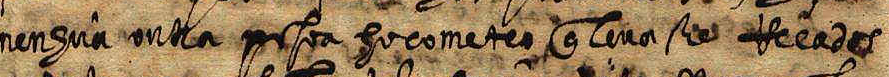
nenhuā outra pesoa ho cometeo q̄ leuasse Recados
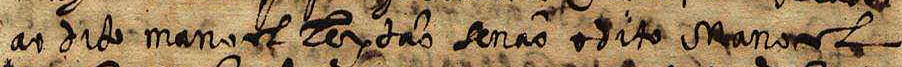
ao dito manoel Leytão senaõ o dito ManoeL
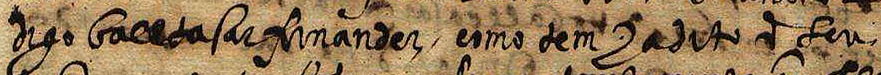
digo balltasar fernandez como tem Ja dito ē seu
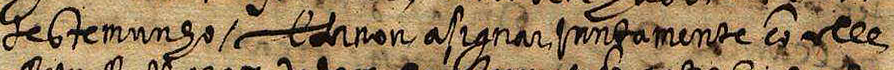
testemunho / E tornou asignar juntamente cō elle
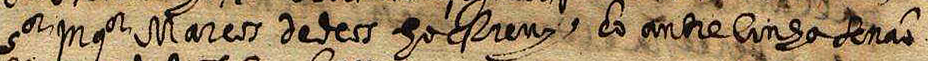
sor jnqor Marcos de deos ho escreuj cō antrelinha senaõ
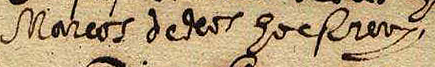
Marcos de deos ho escrevj
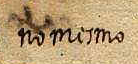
no mesmo
